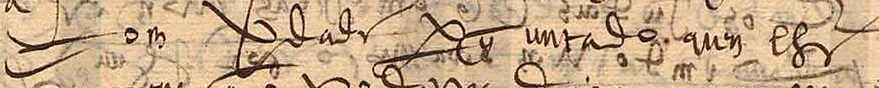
Com Ꝟdade ꝑguntado quen lhe
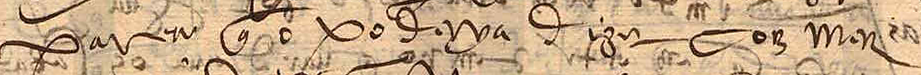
parece q̄ o poderya dizer com men
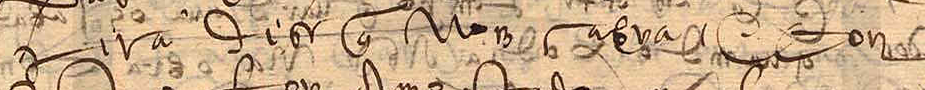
tira dise q̄ nom sabya e con
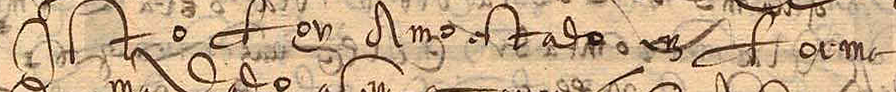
Jsto foy Amoestado em forma
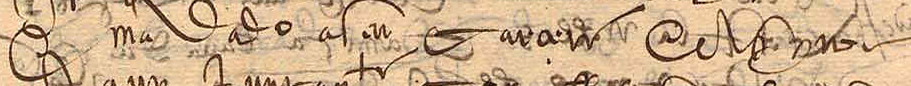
e mādado a seu carçere e Asynou
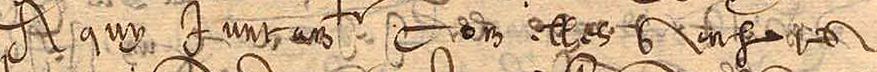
Aquy Juntamte com elles senhores
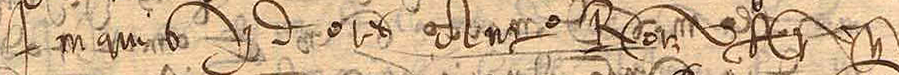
Jmquisydores Anto Rōiz o sp̄vy
